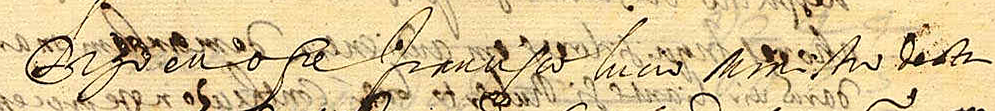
Digo eu o pe francisco lucio Ministro desta
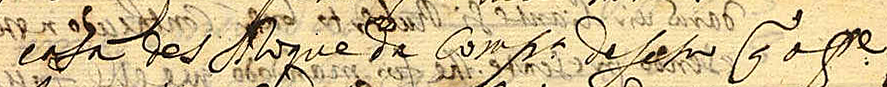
casa de s Roque da Comp.a de jesu q̄ o p.e
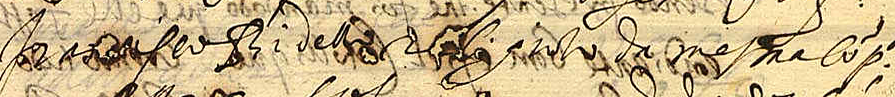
francisco Bidello religiozo da mesma cōp.a
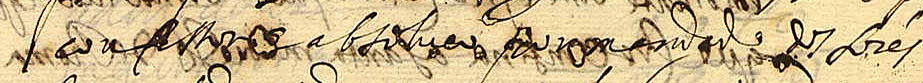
confessor _ absolueo por mandado dos sorēs
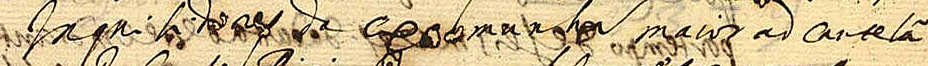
Jnquisidores da excomunhā maior ad cautelā
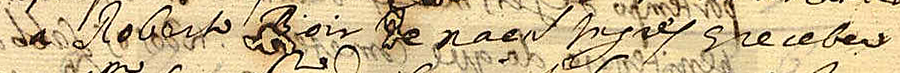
a Roberto Boir de naçā Jngres E recebeo
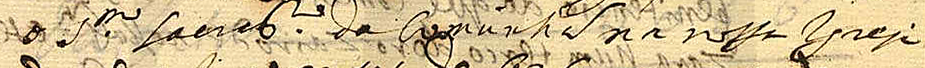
o S.mo Sacram.to da comunhā na nossa Igreja
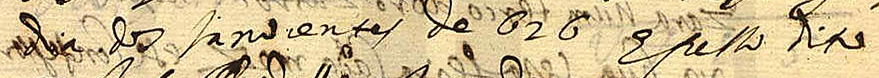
dia dos Jnocentes de 626 E pello dito
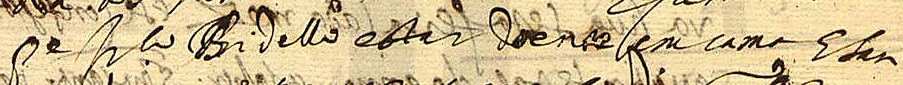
pe frc.o Bidello estar doente em cama E san
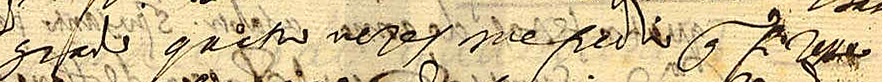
grado quatro uezes me pedio q̄ fizesse
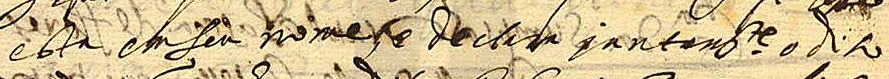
esta em seu nome e declara juntam.te o dito
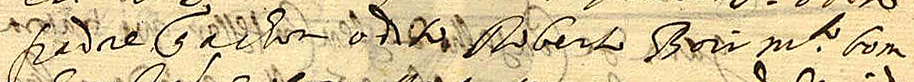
padre q̄ achou o dito Roberto Boir mt.o bom
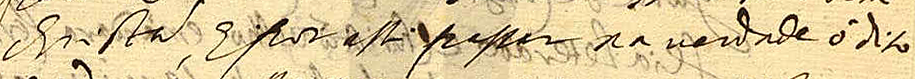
christā E por assi passar na uerdade o dito
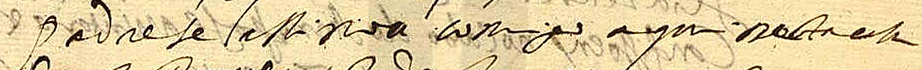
padre se assinou comigo aqui nesta casa
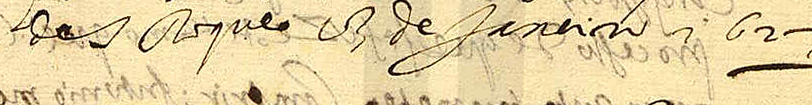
de S Roque 13 de Janeiro i627
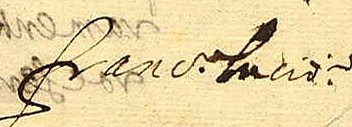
franc.o lucio
